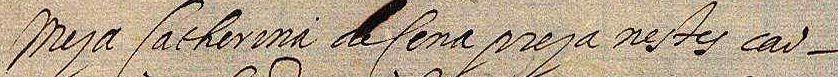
meza Catherina de Cena preza nestes car
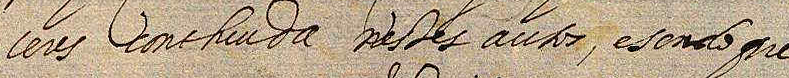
ceres contheuda nestes autos, e sendo pre
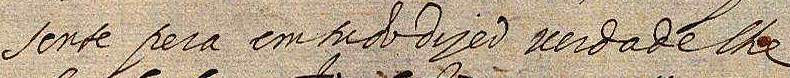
sente pera em tudo dizer uerdade lhe
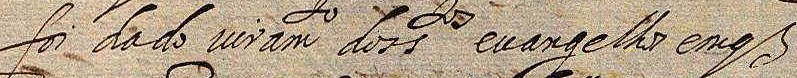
foi dado iuramto dos stos euangelhos em q̅
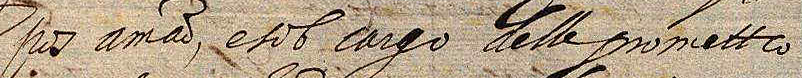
pos a mão, e sob cargo delle prometteo
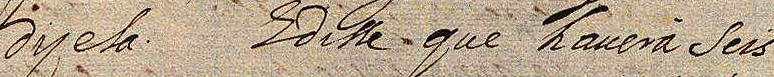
dizela. E disse que hauera seis
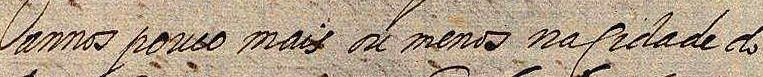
annos pouco mais ou menos na Cidade do
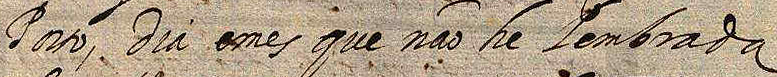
Porto, dia e mes que não he lembrada
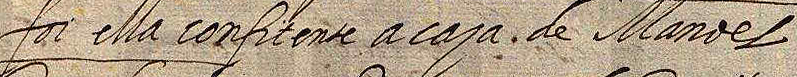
foi ella confitente a caza de Manoel
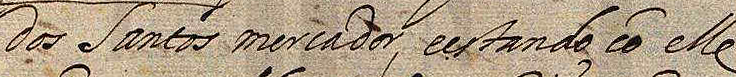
dos Santos mercador, e estando co̅ elle
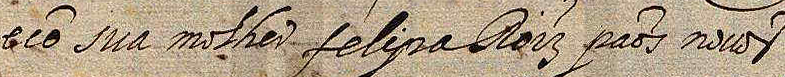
e co̅ sua molher felipa Roiz̅ paõs nouos
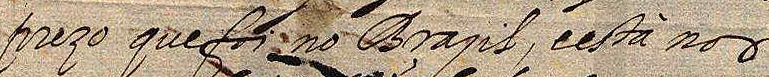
prezo que foi no Brazil, e está nos
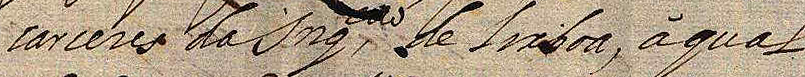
carceres da Inqcaõ de Lixboa, á qual
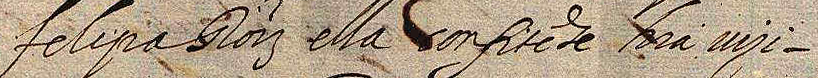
felipa Roiz̅ ella confite̅te hia uizi
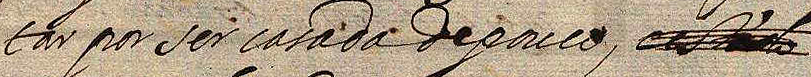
tar por ser casada de pouco _
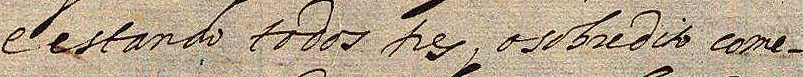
e estando todos tres, o sobredito come
